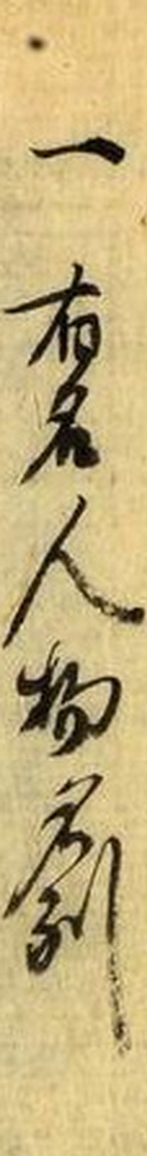一有名人物名列
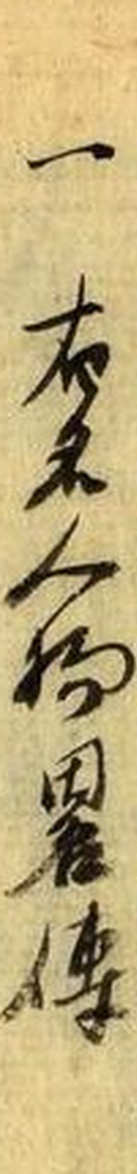一有名人物略伝

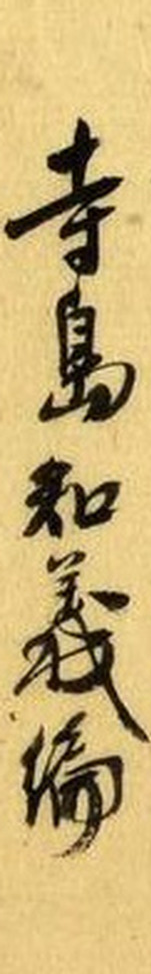寺島知義編
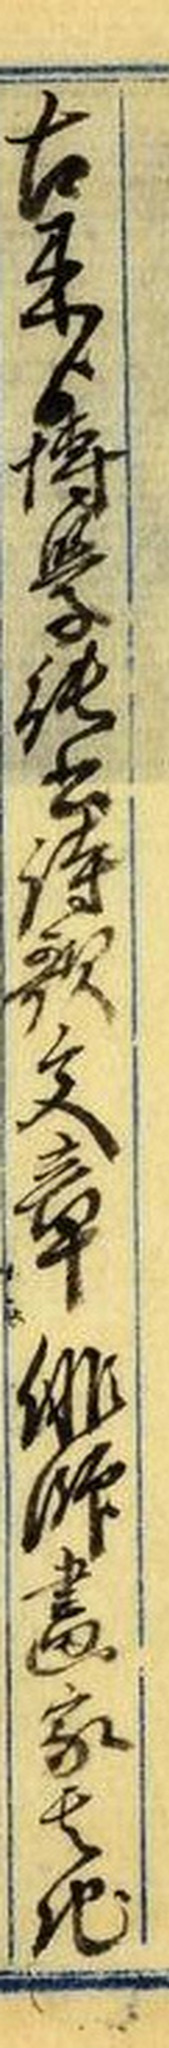古来ゟ博学能書詩歌文章俳師画家其他
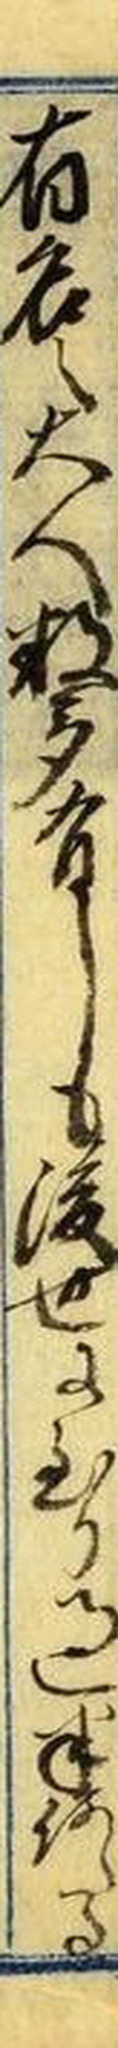有名之大人数多有しも後世に至り過半何たる
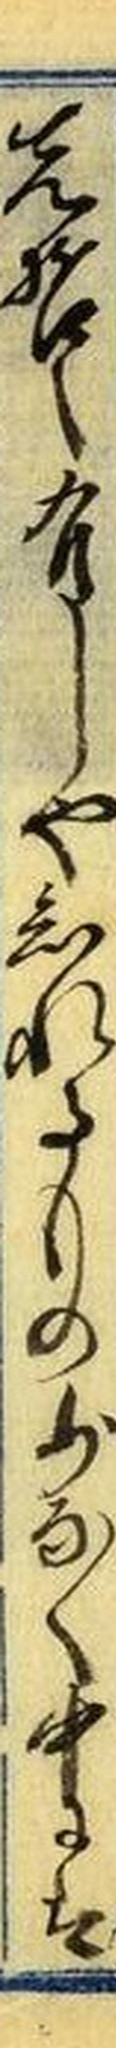先哲之有しや知れるもの少なく中には
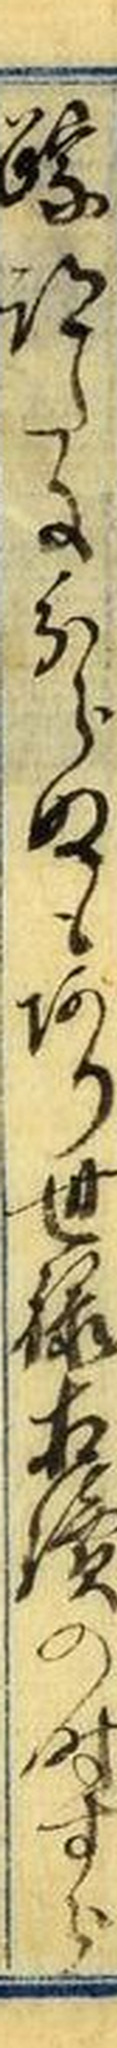踪跡たに分らぬもあり世禄相続の時すら
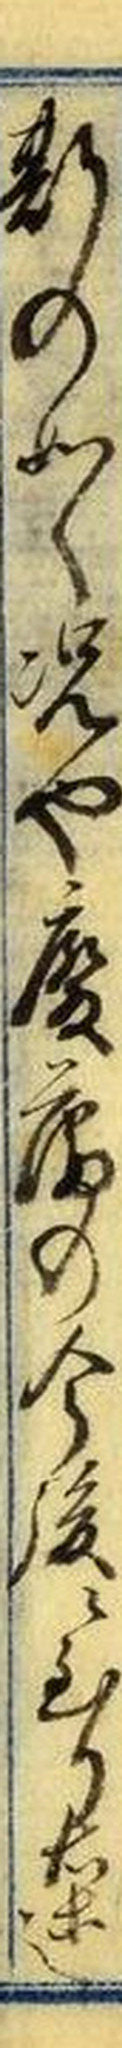斯の如く況や廃藩の今後に至り右等之
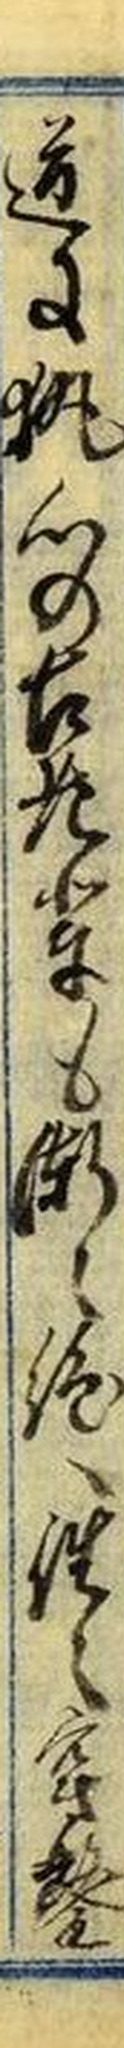道に執心の古老輩も漸く絶へ往々穿鑿
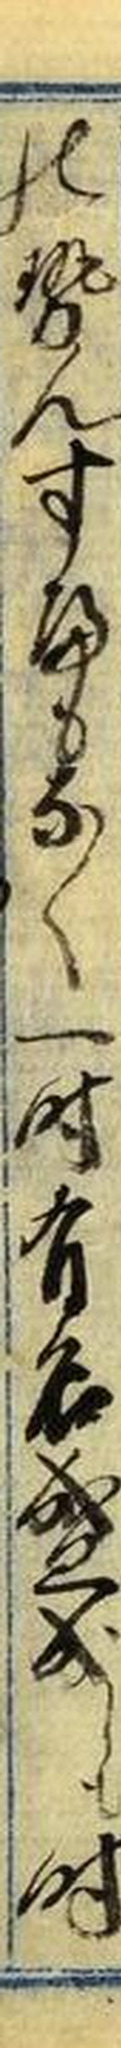の勢んすへもなく一時有名盛成りしも時
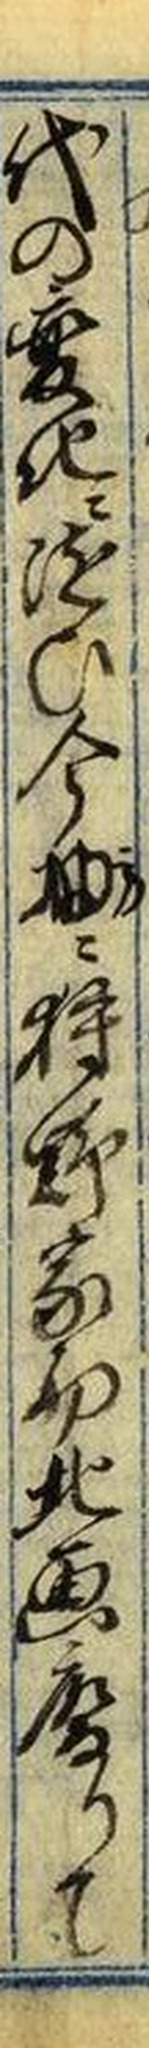代の変化に随ひ今方に狩野家初北画廃りて
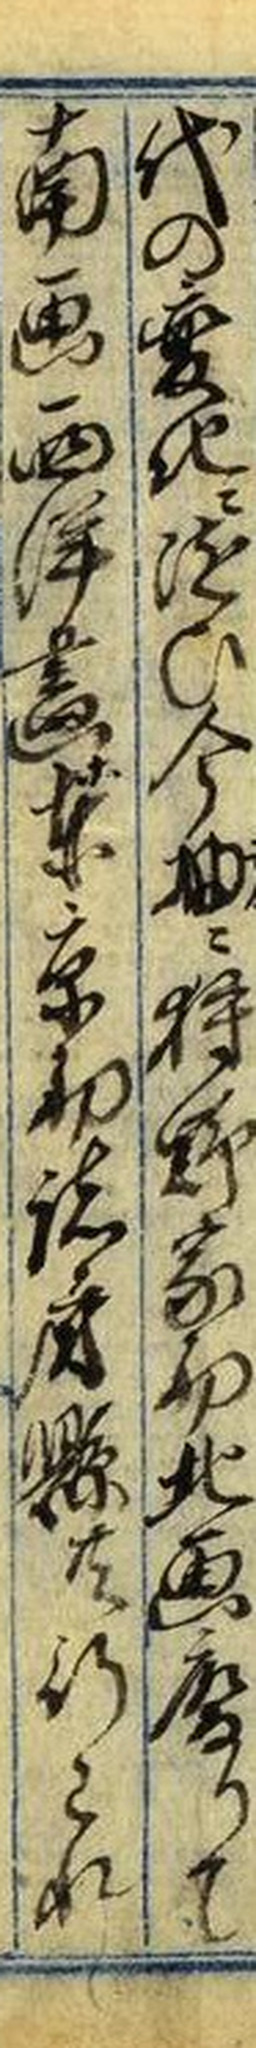南画西洋画等東京初諸府県共行われ

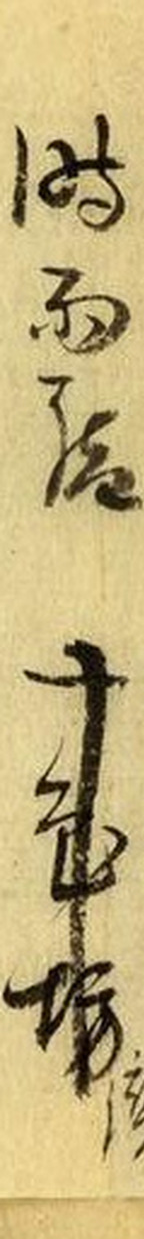時雨庵一色坊

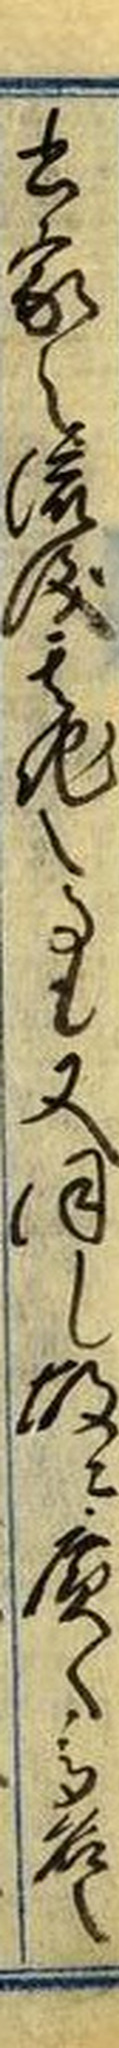書家之流儀其他之事も又同し故に広く高名之
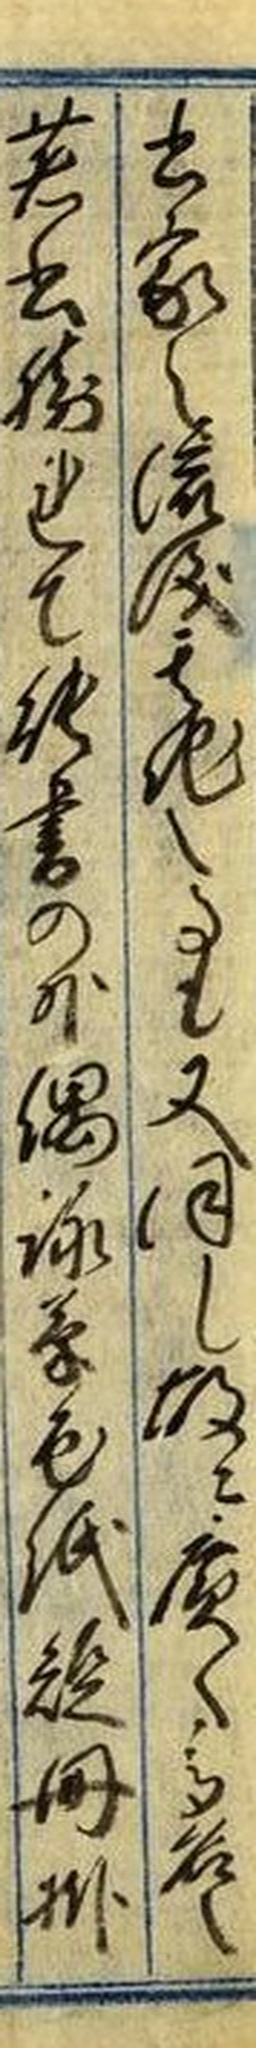著書勝れて能書の外偶詠草色紙短冊掛
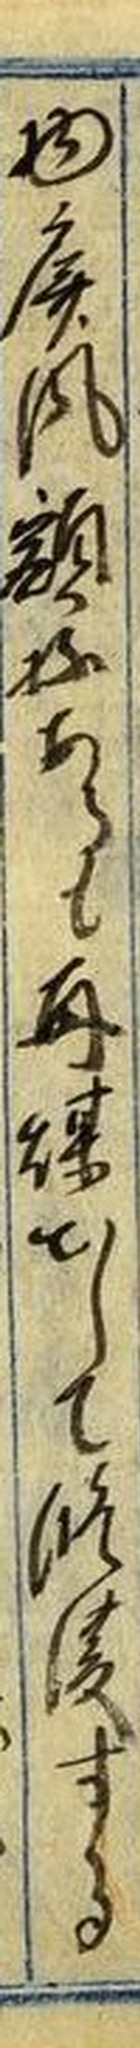物屏風額抔あるも再煤出して修復する
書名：温古集 四巻
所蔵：福井県文書館 Fukui Prefectural Archives
